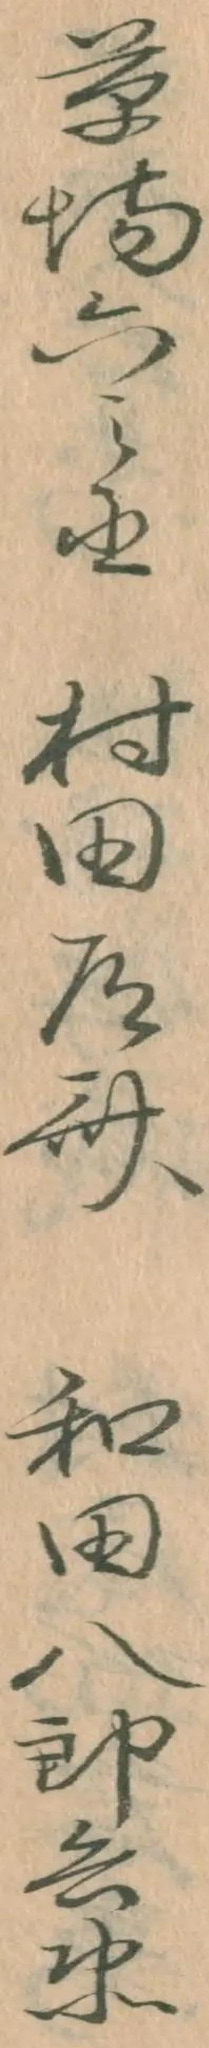草場六之丞村田道斎和田八郎兵衛
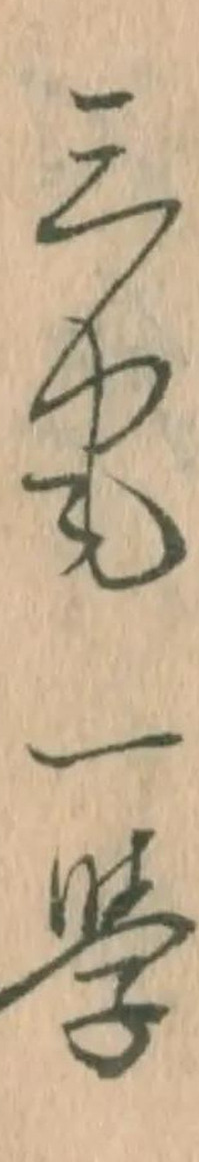三宅一学
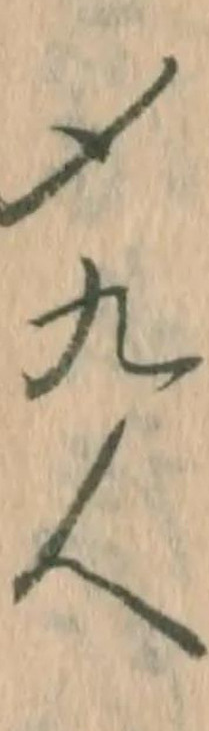〆九人
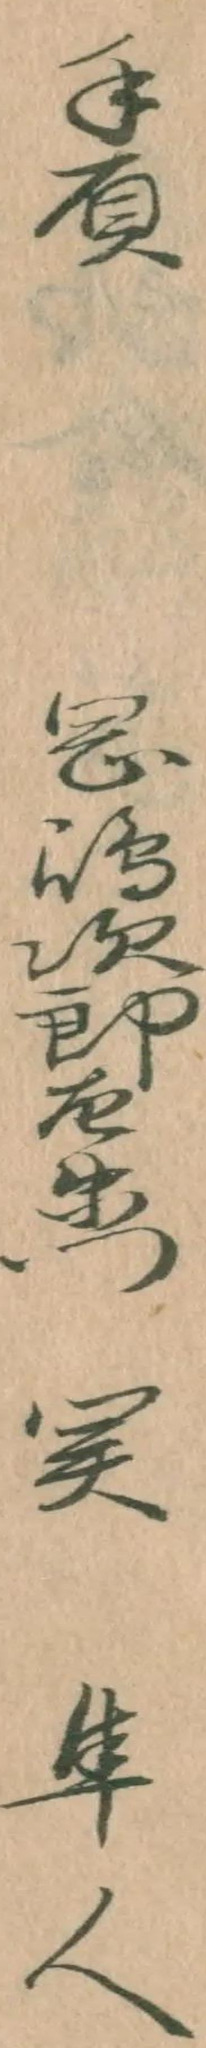手負岡島次郎左衛門関隼人
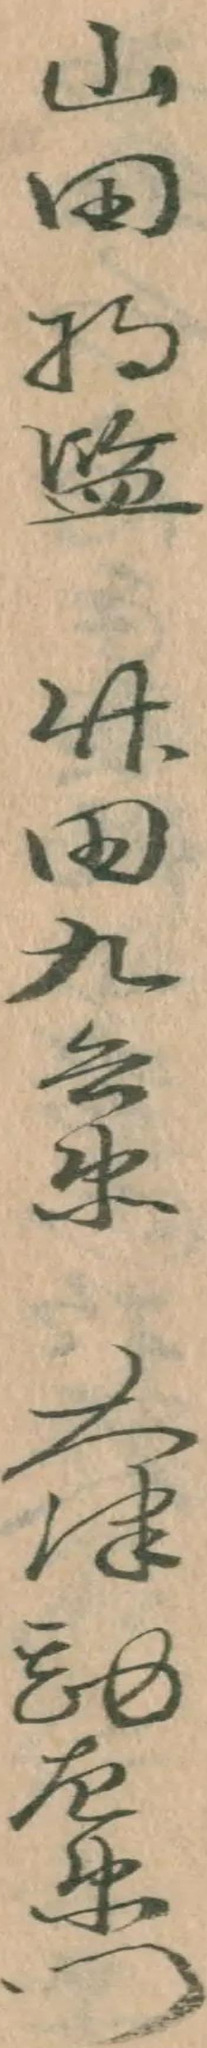山田将監斉田九兵衛大津勘左衛門
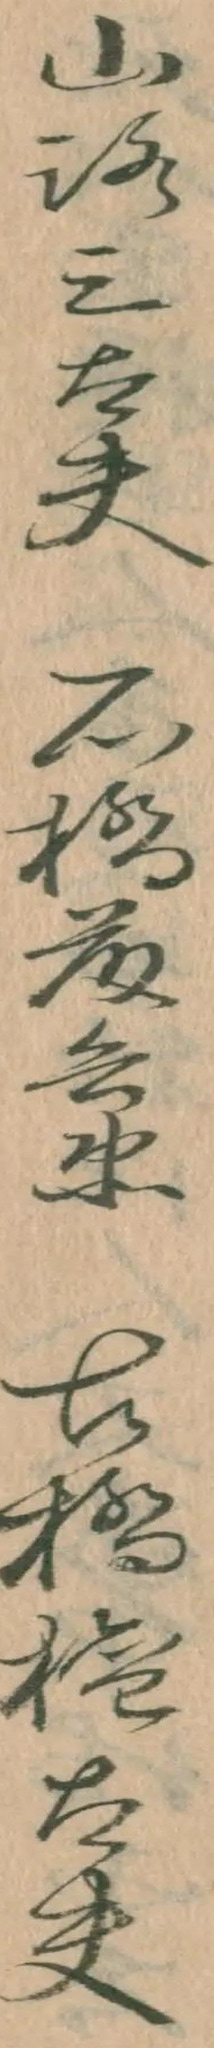山路三太夫石橋藤兵衛古橋権太夫
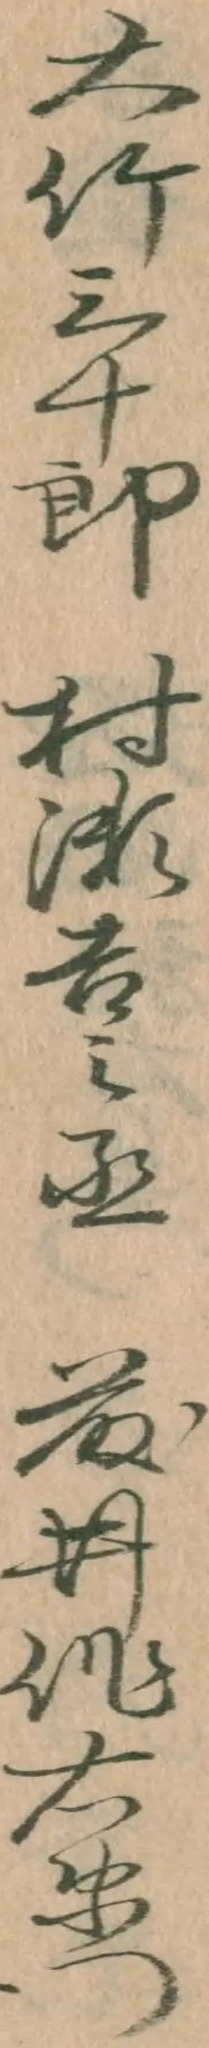大竹三十郎村瀬吉之丞藤井作右衛門
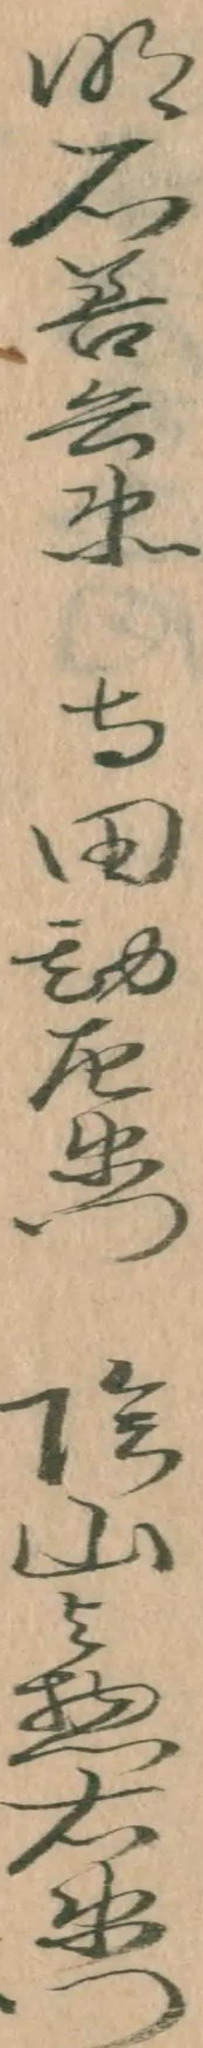明石前兵衛寺田勘左衛門陰山与惣右衛門
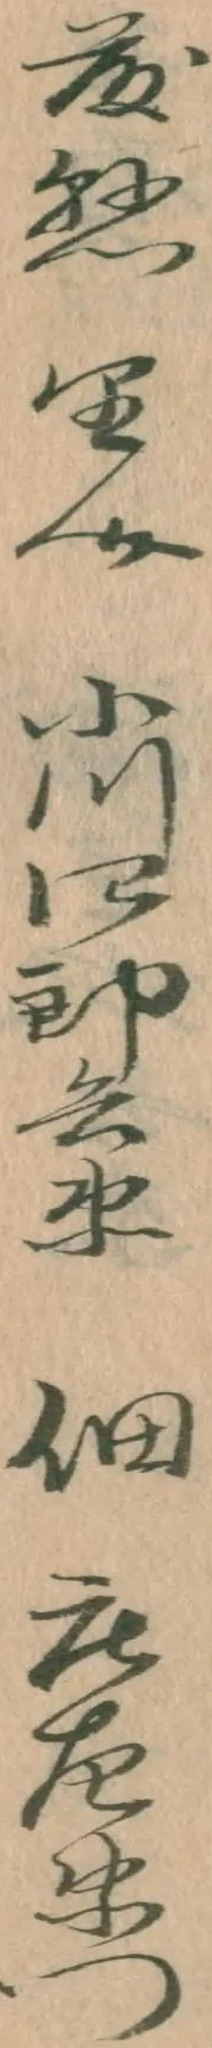藤懸坐助小川四郎兵衛佃庄左衛門
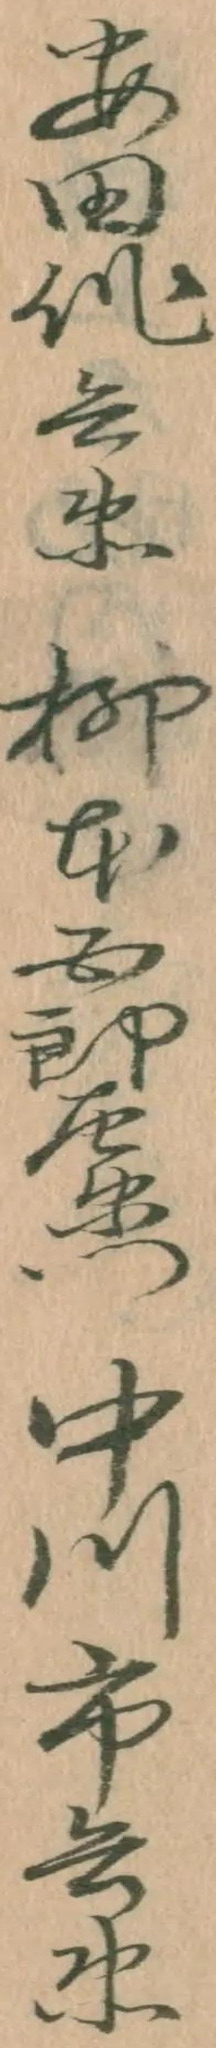安田作兵衛柳本五郎左衛門中川市兵衛
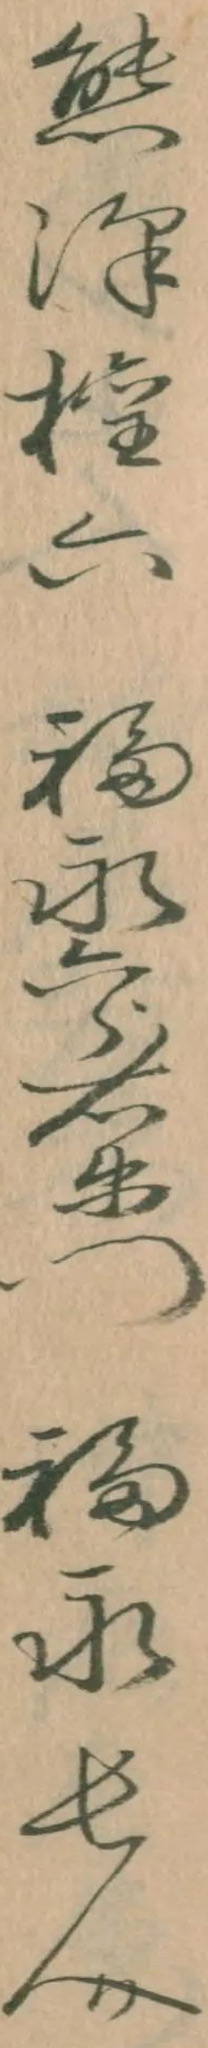熊沢権六福永六郎右衛門福永長助
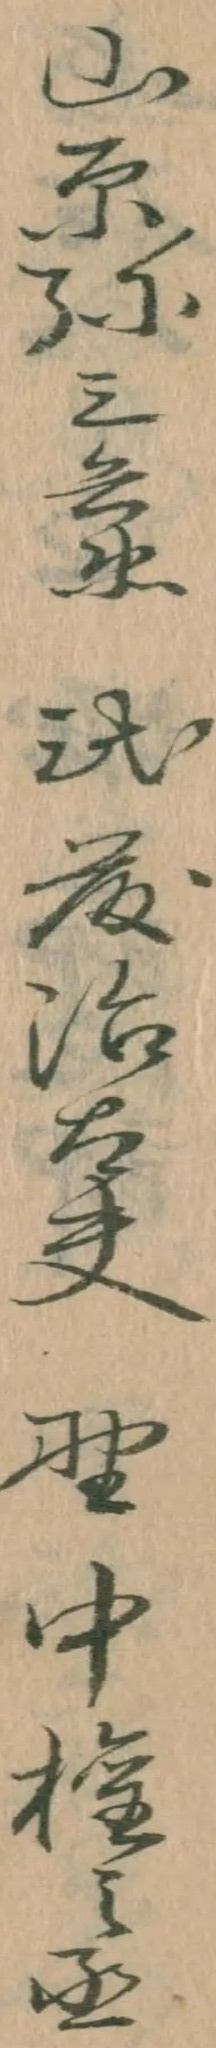山原孫三兵衛武藤治太夫野中権之丞
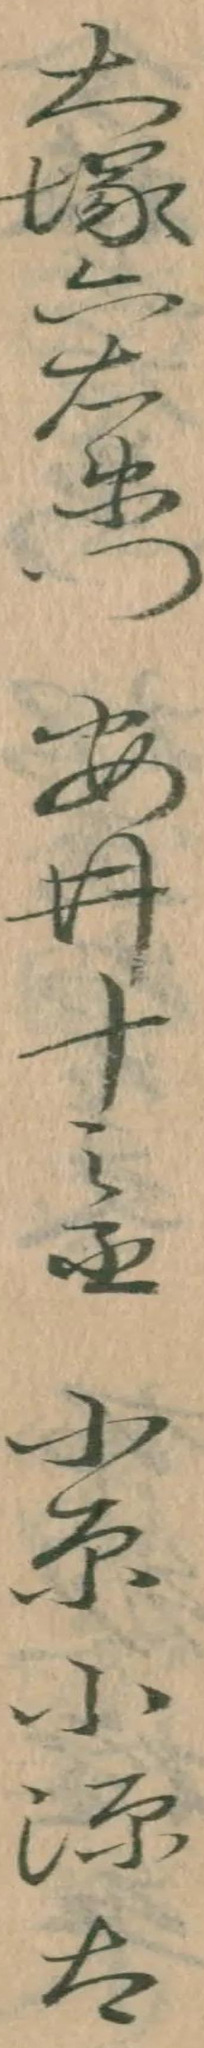大塚六右衛門安井十之丞小原小源太
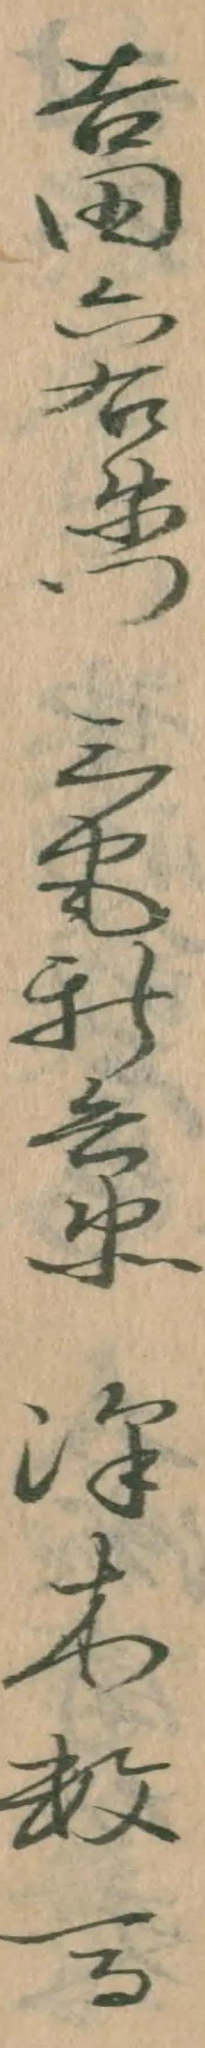吉田六右衛門三宅新兵衛沢木数馬
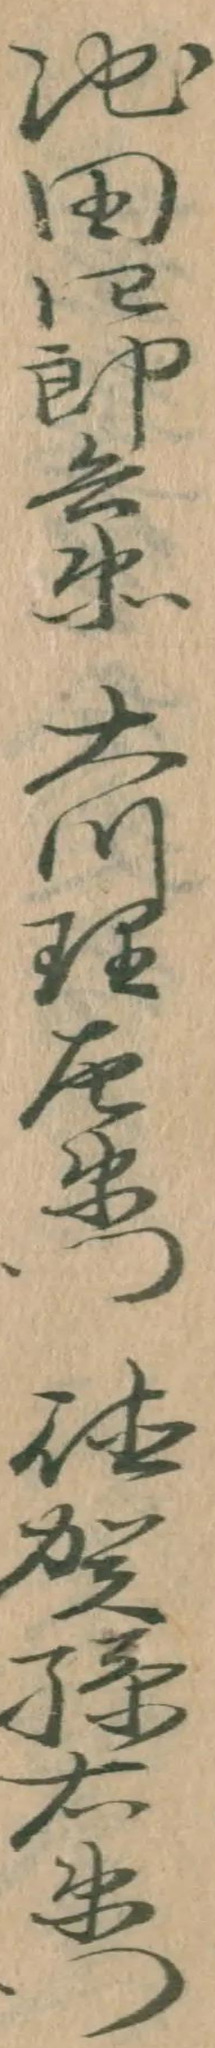池田四郎兵衛大川理左衛門徳賀孫右衛門
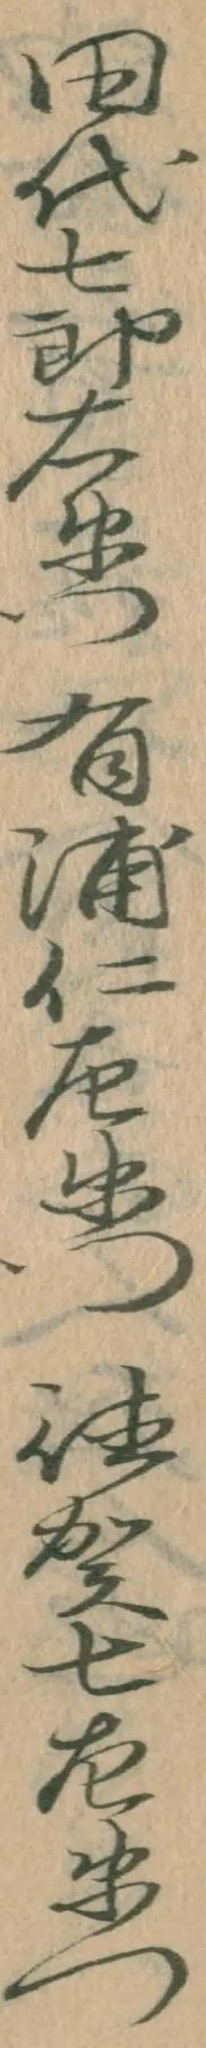田代七郎右衛門有浦仁左衛門徳賀七左衛門
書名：切支丹御退治記 49巻. [9]
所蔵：国立国会図書館 National Diet Library, JAPAN
